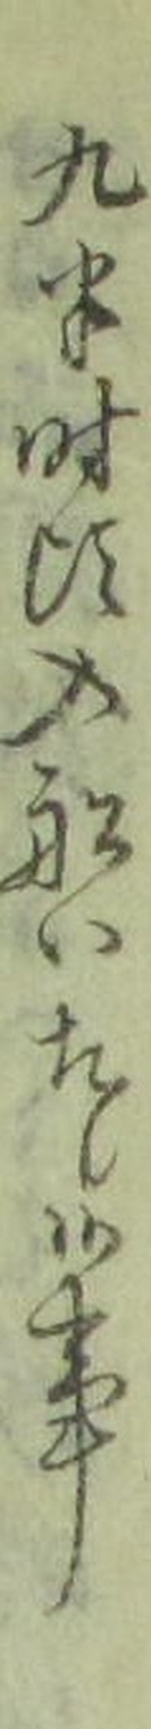九半時頃入船いたし候事
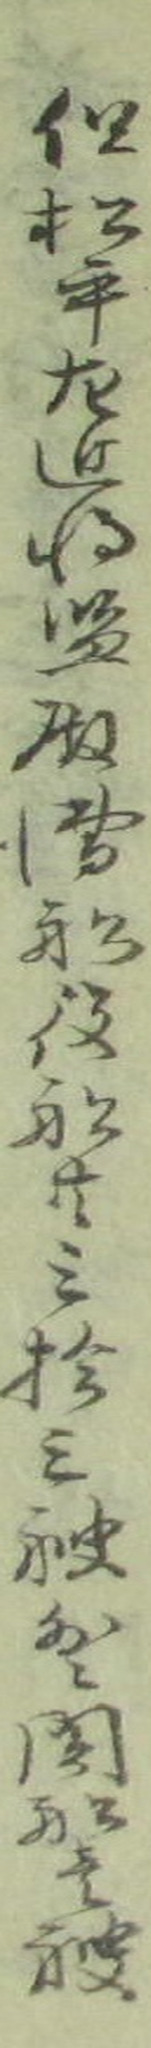但松平左近将監殿漕船役船共三拾三艘分と関船壱艘
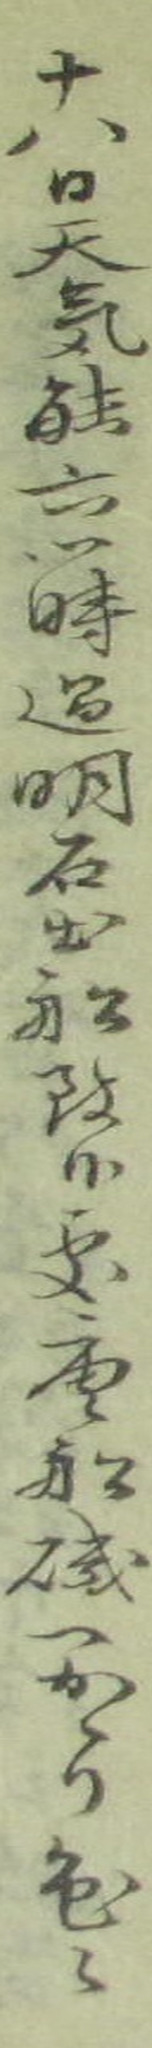十八日天気能六ツ時過明石出船致候処唐船磯へかゝり色々
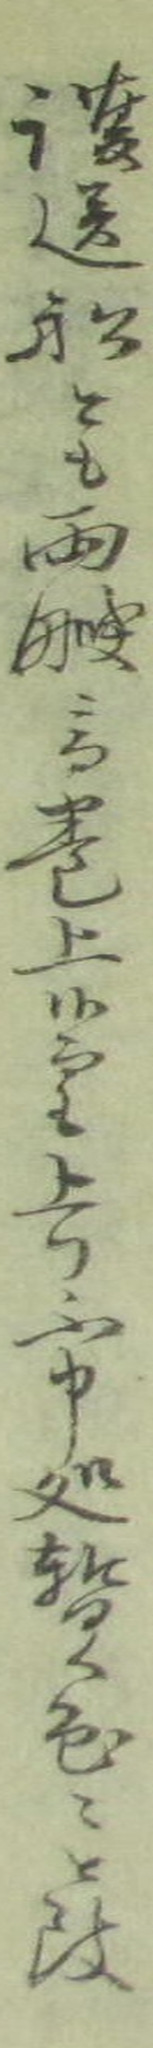護送船とも両艘に而巻上候而も上り不申処暫く色々と致
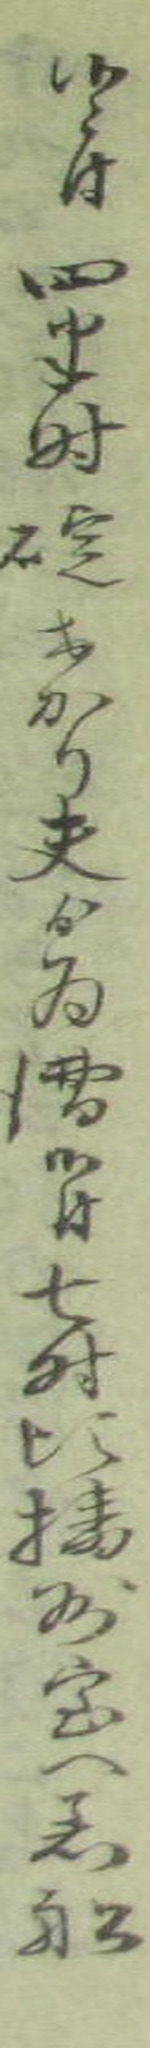候に付四半時碇かり夫ゟ為漕候付七時頃播州室へ着船
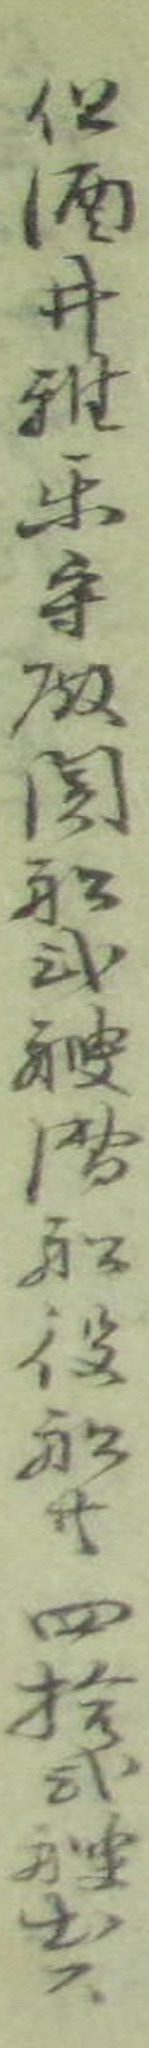但酒井雅樂守殿関船弐艘漕船役船共四拾弐艘出ス

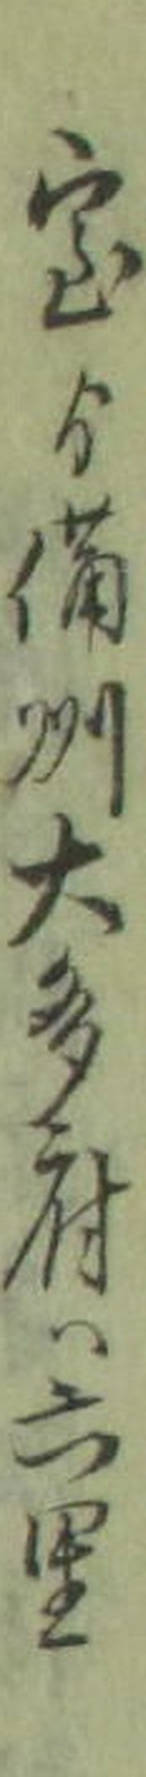室ゟ備州大多府へ六里
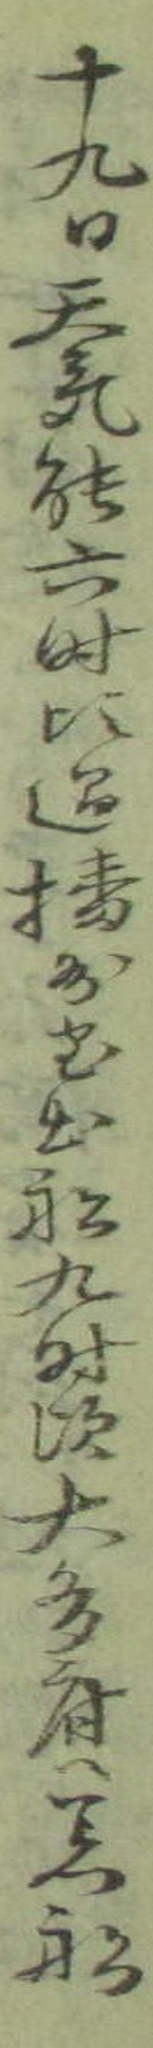十九日天気能六時頃過播州室出船九時頃大多府へ着船
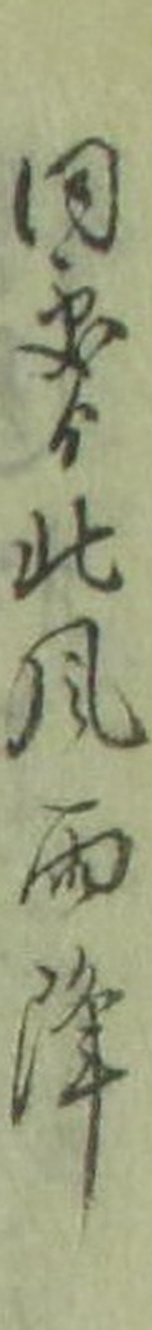同所ゟ北風雨降
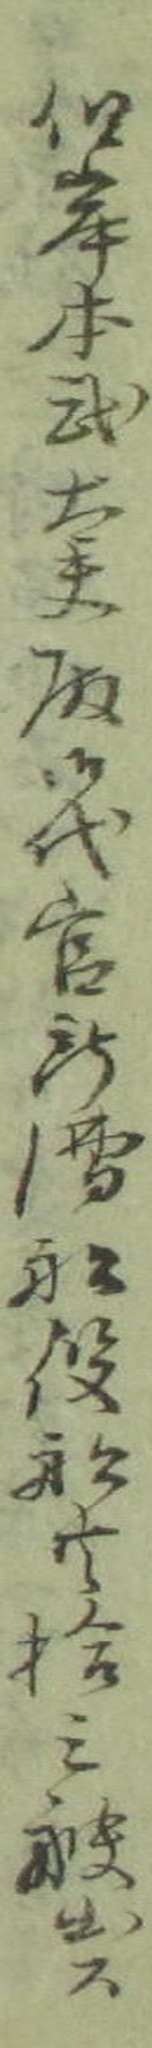但岸本武太夫殿御代官所漕船役船共拾三艘出ス
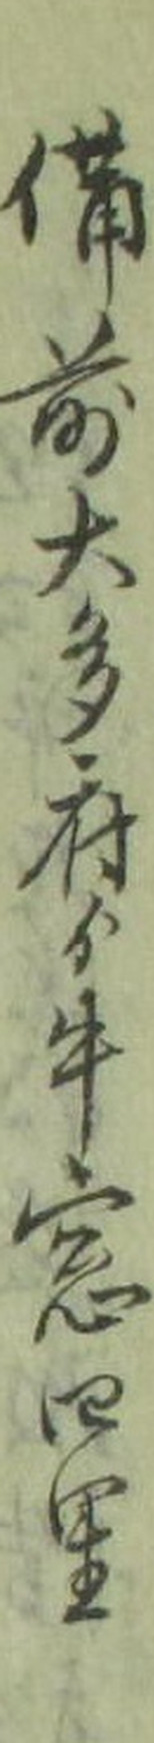備前大多府ゟ牛窓四里
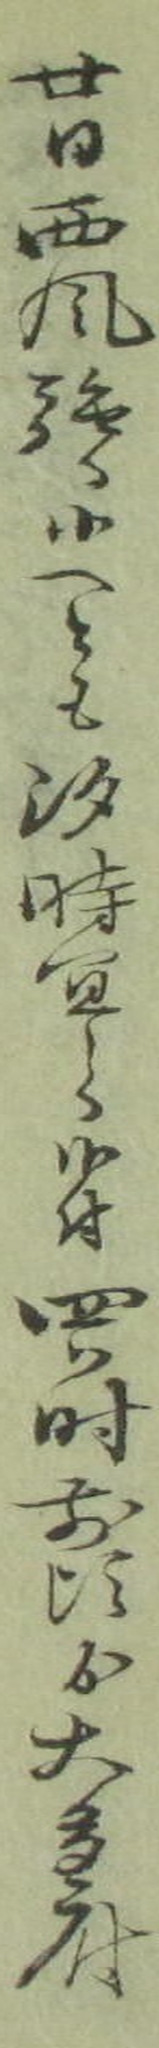廿日西風強く候へとも汐時宜しく候付四ツ時前頃ゟ大多府
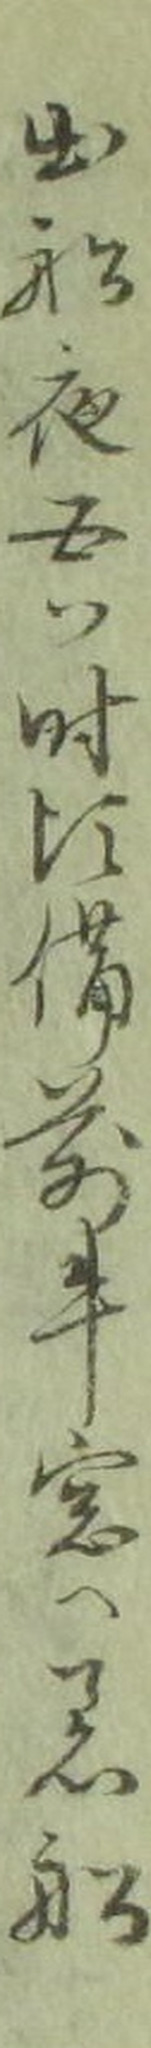出船夜五ツ時頃備前牛窓へ着船
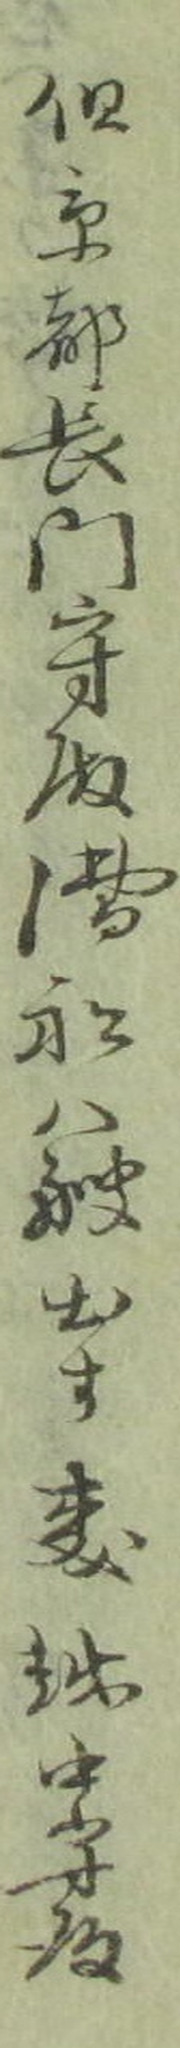但京都長門守殿漕船八艘出す森越中守殿
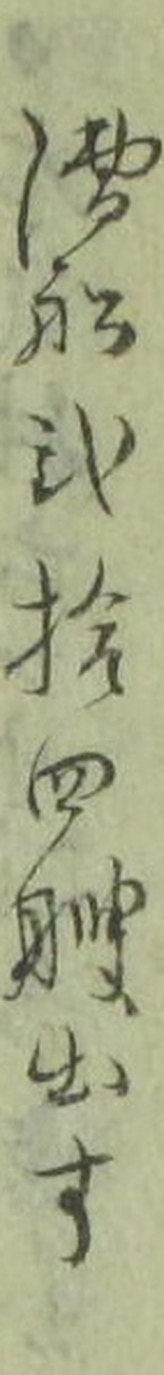漕船弐拾四艘出す
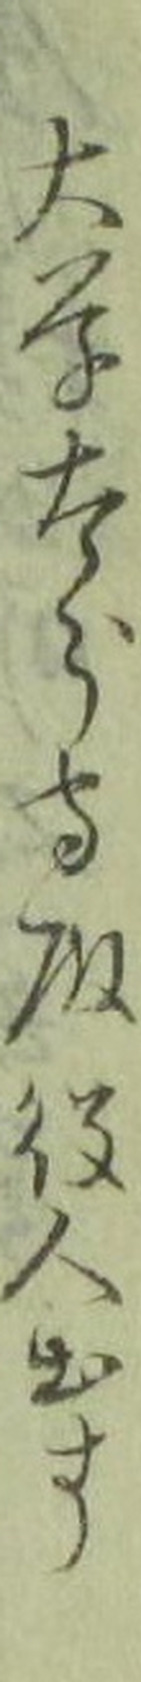大草太分寺殿役人出す
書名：紀州九木浦庄屋記録 四
